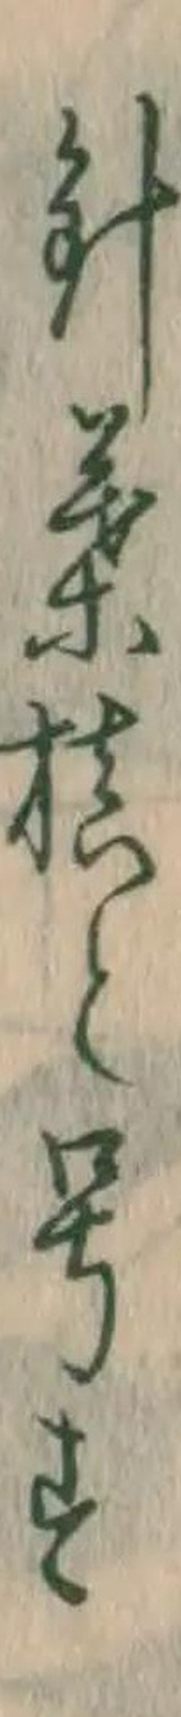針葉槙と号す
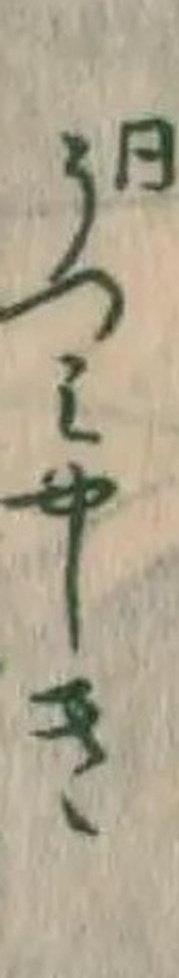うつみやしき
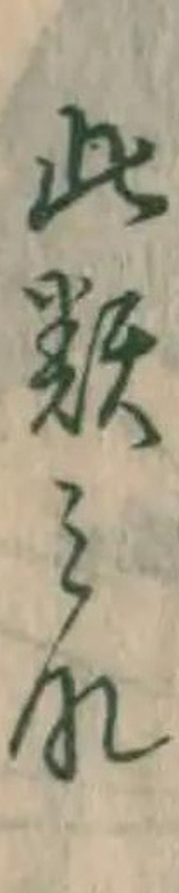此類みな
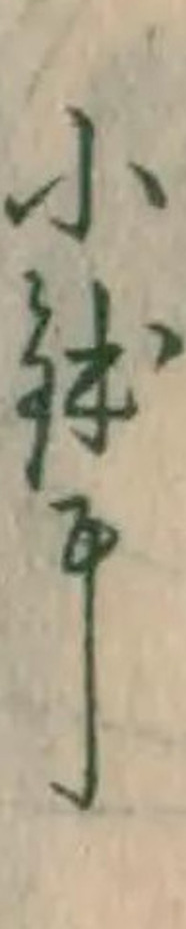小鉢に
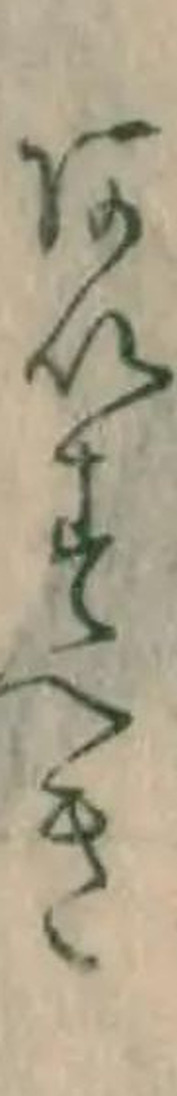あいすへき

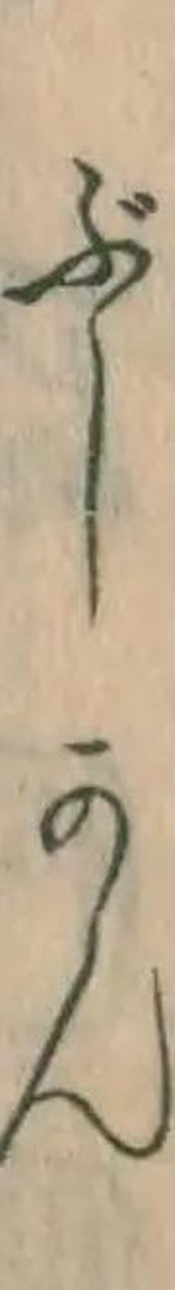ぶしかん
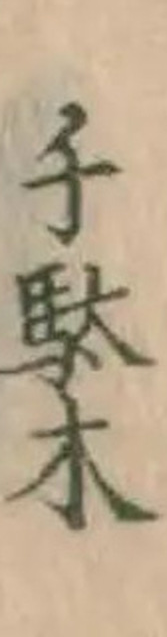千駄木
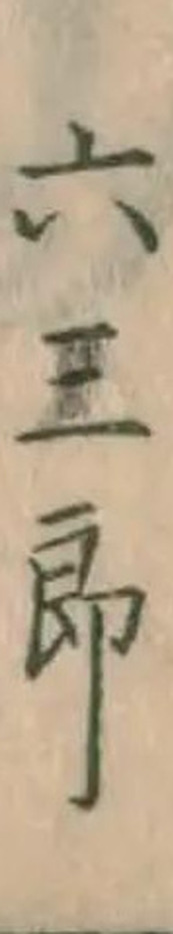六三郎
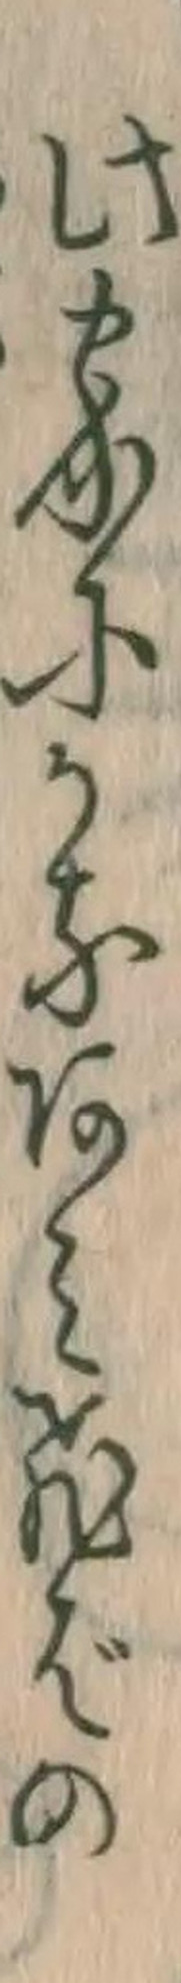此家にかなあみひばの
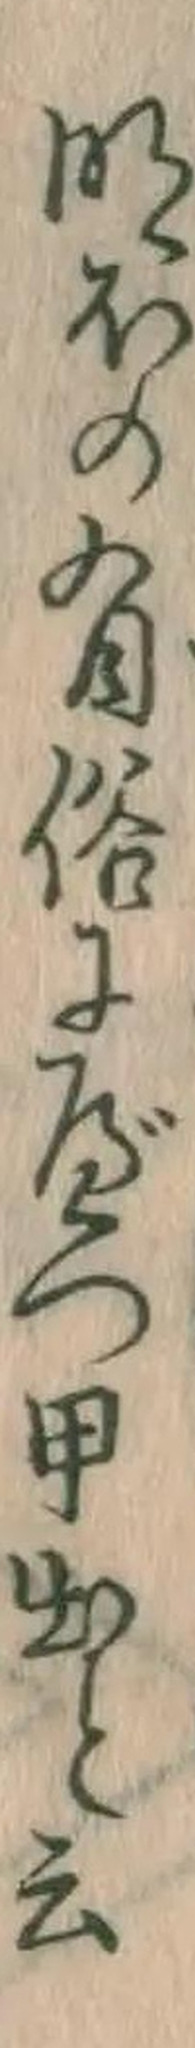明ほの有俗にべつ甲出と云
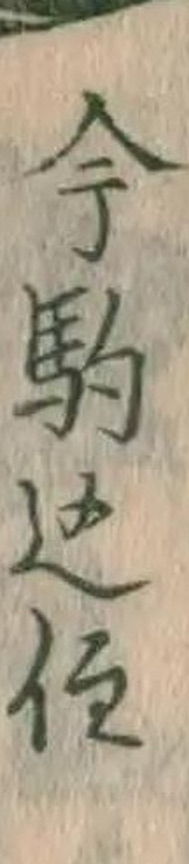今駒込住
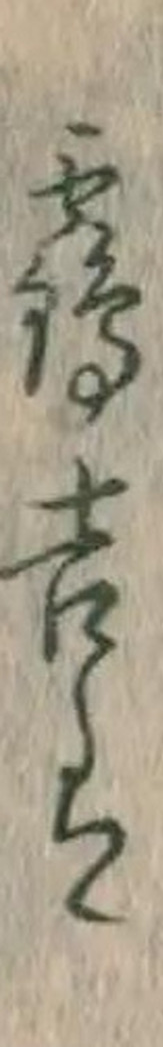鶴吉は
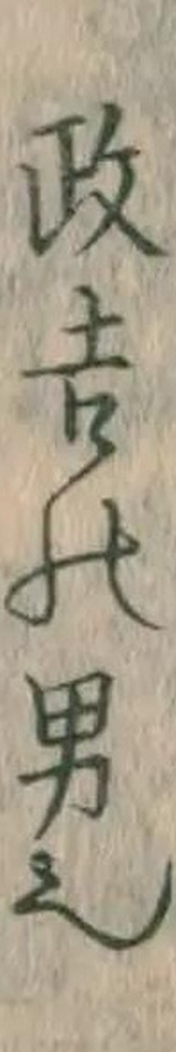政吉の男也
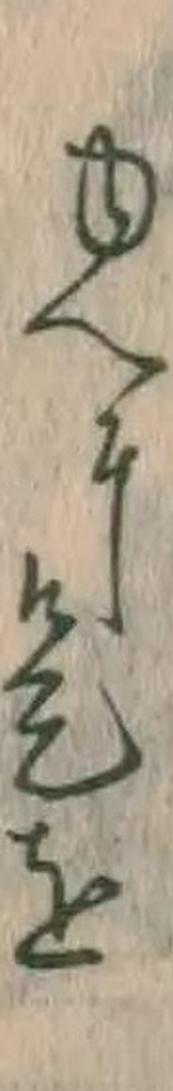ゆへに是を
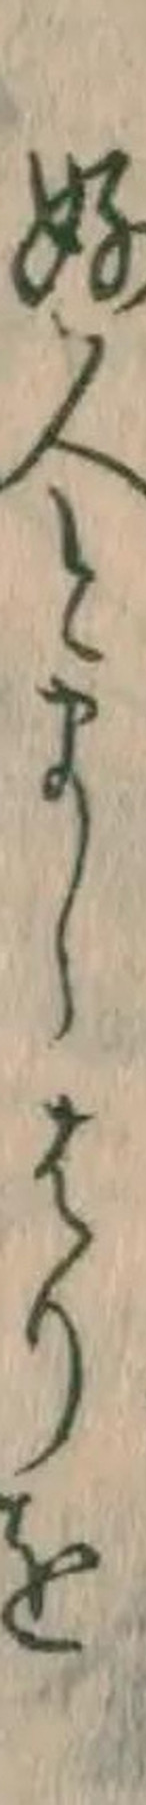好人とましはりを
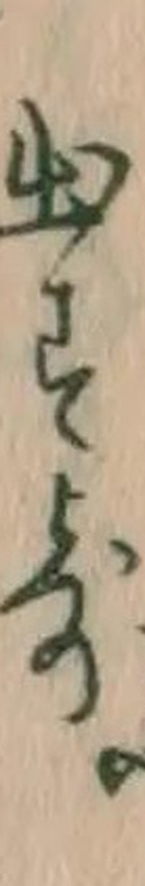出す奇
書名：草木奇品家雅見 3巻. [3]
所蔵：国立国会図書館 National Diet Library, JAPAN
